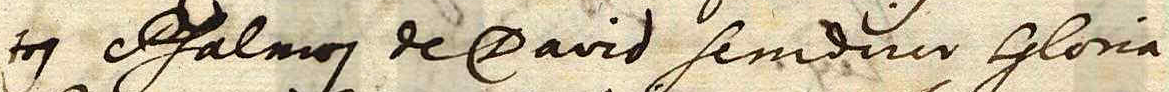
tos Psalmos de David sem dizer Gloria
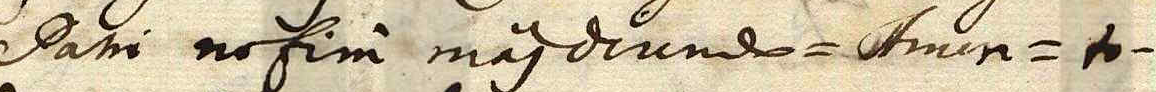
Patri no fim mâs dizendo = Amen = to
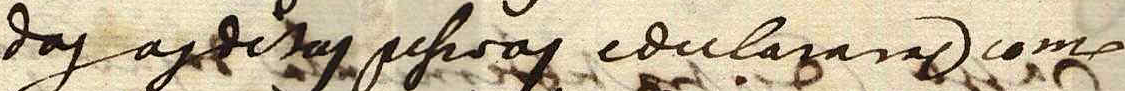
das as ditas pessoas e declararaõ como
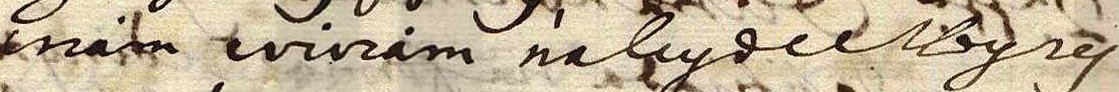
criam, e viviam na ley de Moyzes
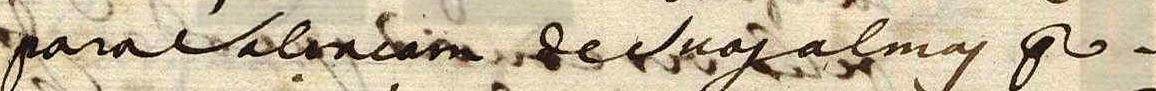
para salvaçam de suas almas pro
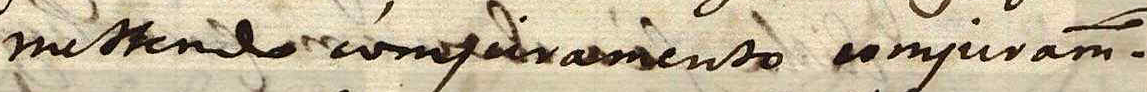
mettendo com juramento com juramto.
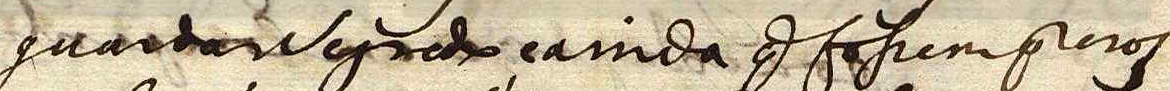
guardar segredo, e ainda q̄ fossem prezoz
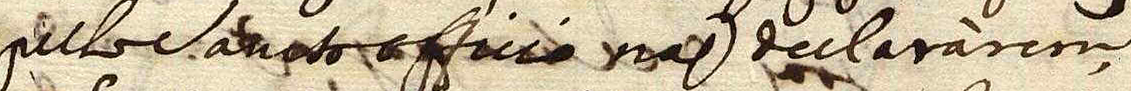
pello sancto officio naõ declarárem,
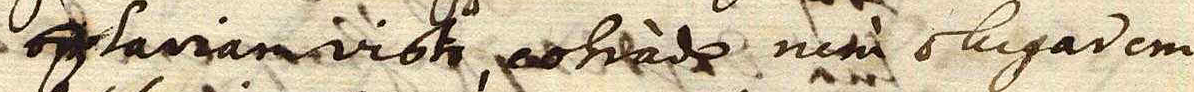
o q̄ haviam visto, e obràdo, nem o lugar em
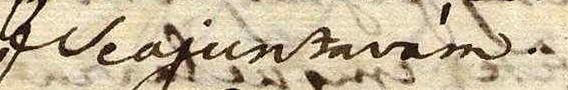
q̄ se ajuntavam.
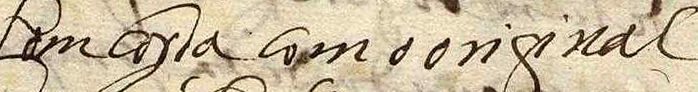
Concorda com o original
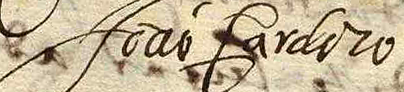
Joaõ Cardozo
